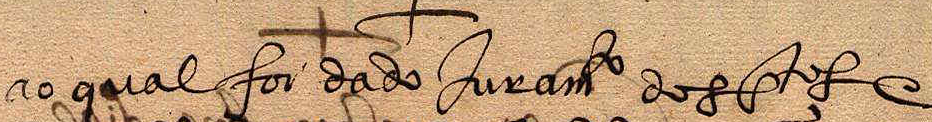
ao qual foi dado Juramto dos stos e
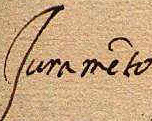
Juramēto
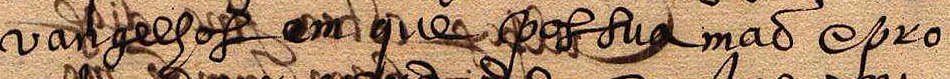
vangelhos em que pos sua maõ e pro
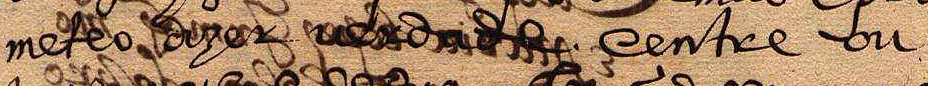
meteo dizer uerdade e entre ou
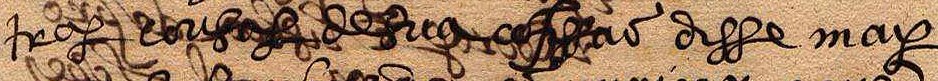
tras cousas de sua cōfissaõ disse mais
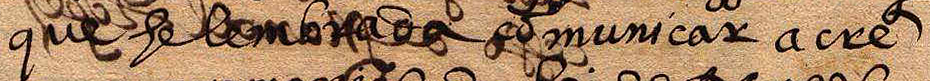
que he lembrada cōmunicar a crē
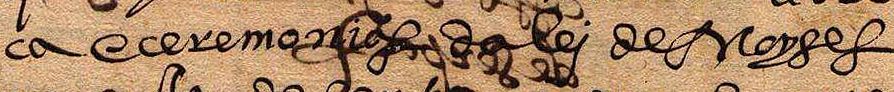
ça e ceremonias da lej de Moyses
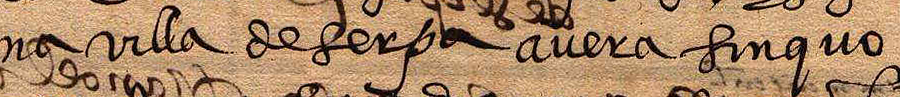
na villa de serpa auera sinquo
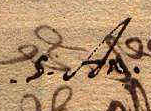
5. An.
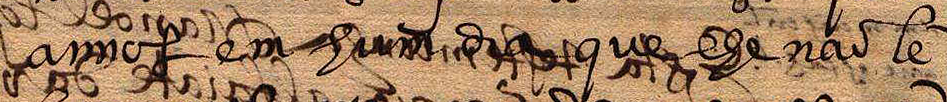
annos em hum dia que lhe naõ lē
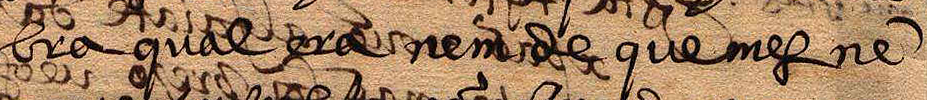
bra qual era nem de que mes nē
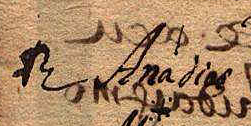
R Ana dias
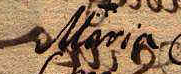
Maria
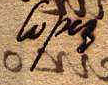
lopez
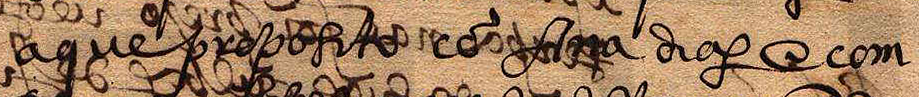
a que proposito cō Ana dias e com
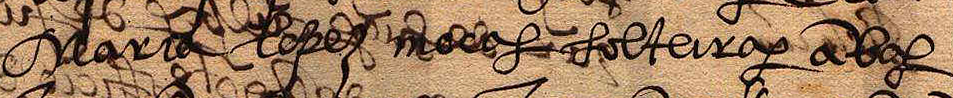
Maria lopez moças solteiras ābas
